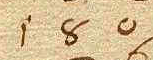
i80
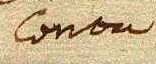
conta
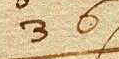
36
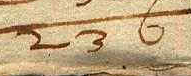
236
